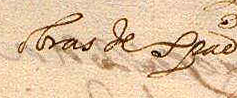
obras de xpaõ
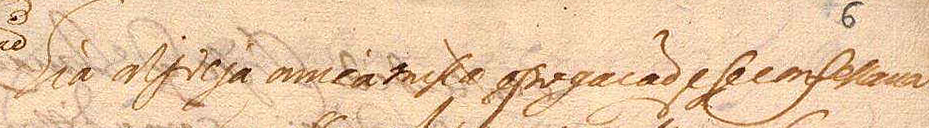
hia a Igreja ouuia missa e pregaçaõ e se confessaua
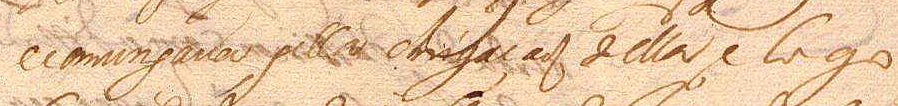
e comungaua pella obrigaçaõ della, e logo
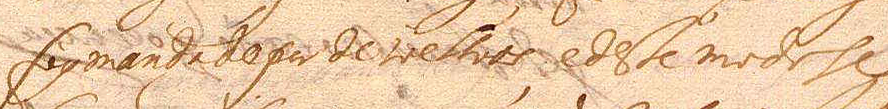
foy mandado por de ioelhos e deste modo se
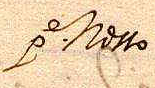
pe. Nosso
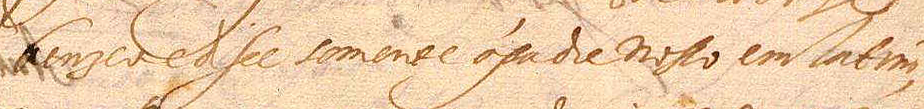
benzeo e disse somente o padre nosso em latim,
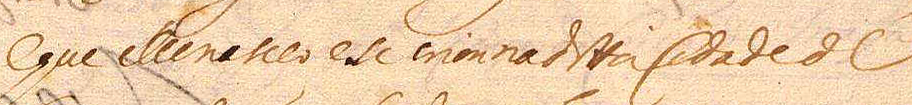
e que elle nasceo e se criou na ditta Cidade de
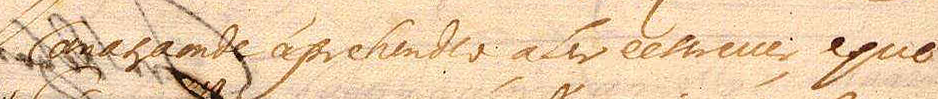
Canas aonde aprehendeo a ler e escreuer, e que
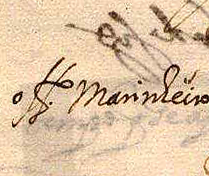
off.o marinheiro
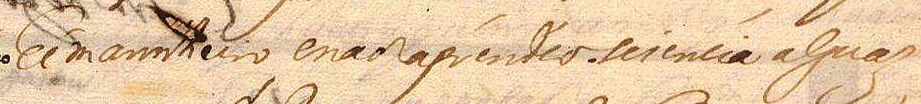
hé marinheiro e naõ aprendeo sciencia alguā
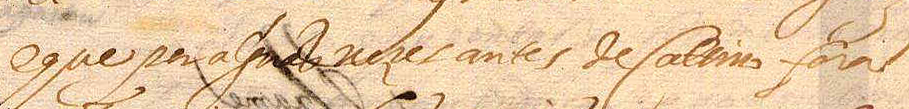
e que por alguās uezes antes de Cattiuo fora
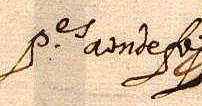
p.es aonde foj
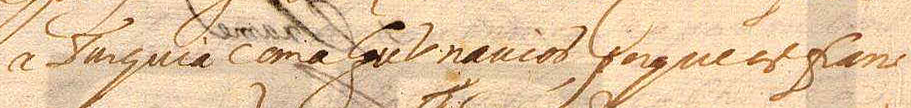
a Turquia com algūs nauios, porque os fran
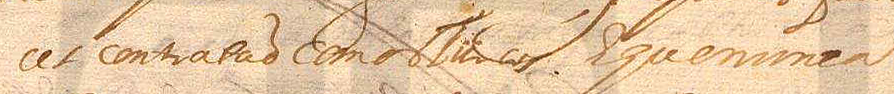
ces contrataõ com os Turcos E que nunca
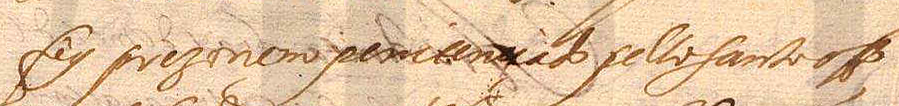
foy prezo nem penitenciado pello santo offo
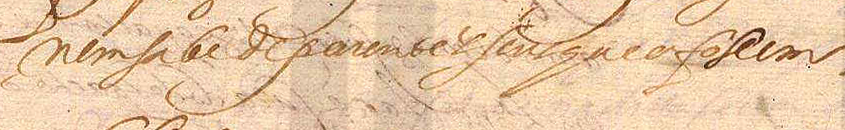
nem sabe de parentes seus que o fossem
